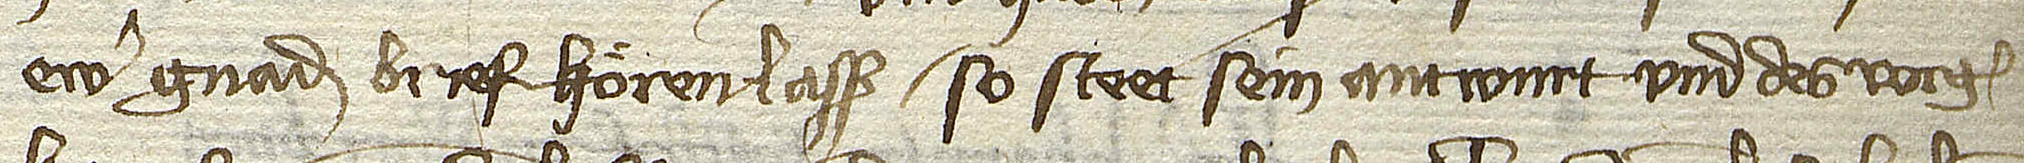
ew* gnad* brief hören laſſ* / ſo ſteet ſein antwurt vnd des vorg*
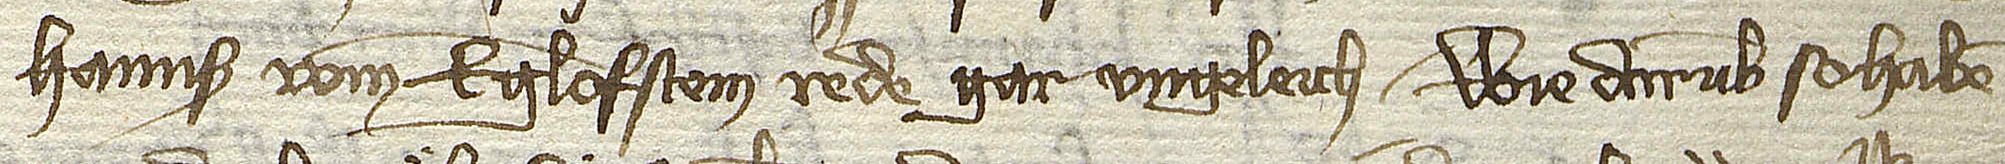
hannſ* vom* Eglofſtein rede gar vngeleich / Wie daru*b ſo habe*
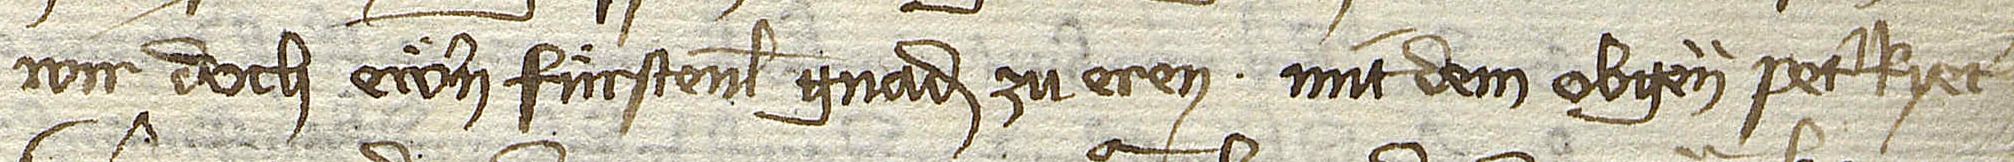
wir doch ew*n fürſtenl* gnad* ʒu eren . mit* dem obgen* pet* Ryet*
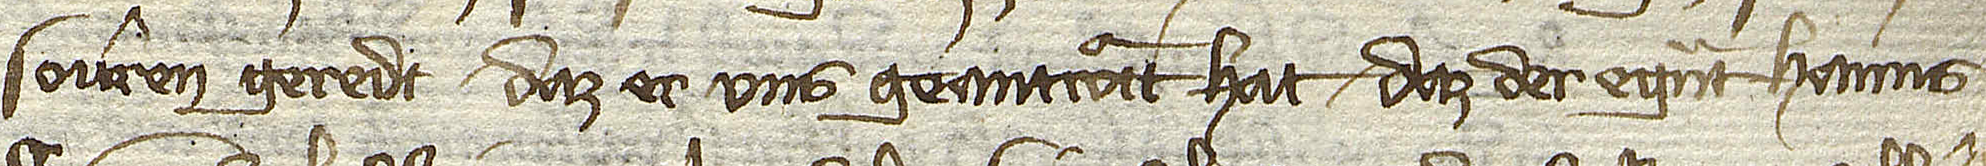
ſou*ren geredt / daʒ er vns geantw*tt hat / daʒ der egnt* hanns
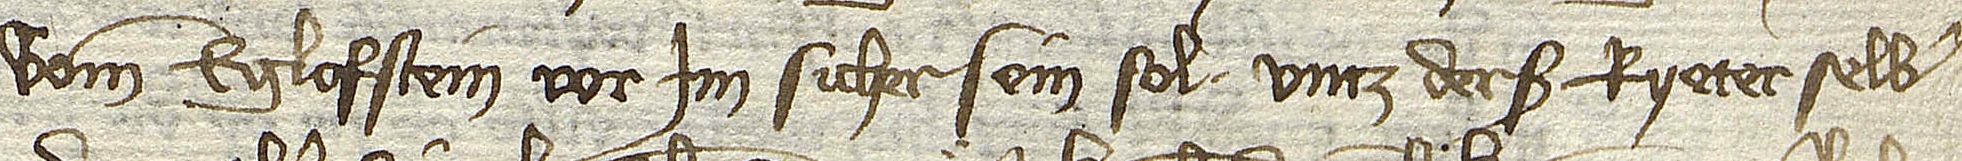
vom* Eglofſtein vor Im ſicher ſein ſol . vncʒ derſ* Ryeter ſelb*
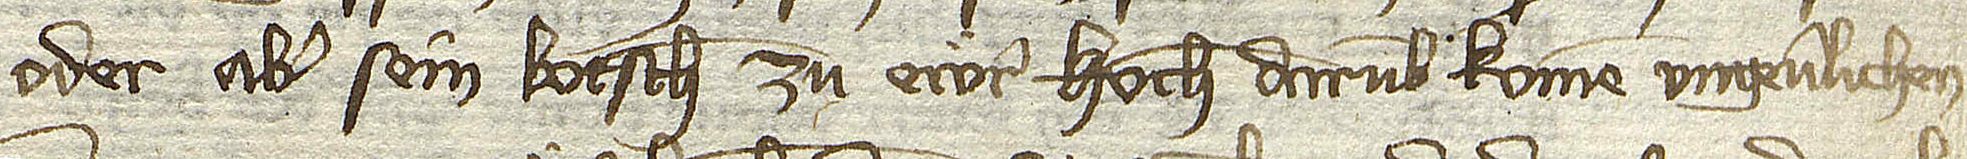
oder ab* ſein botſch* ʒu ew*r hoch* daru*b kome* vngeu*lichen
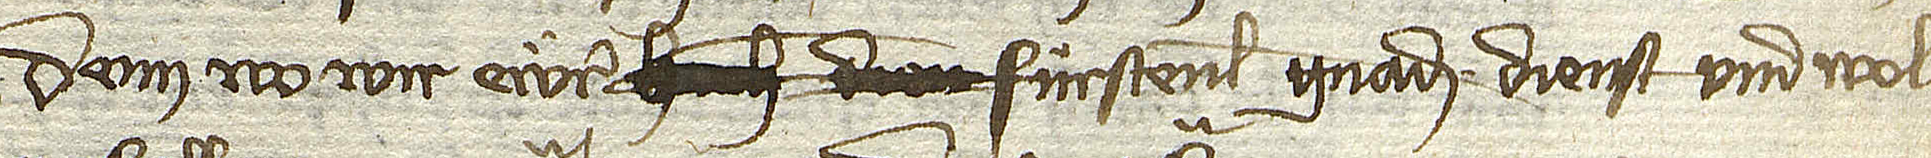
Denn wo wir ew*r hoch* dien* fürſtenl* gnad* . dienſt vnd wol =
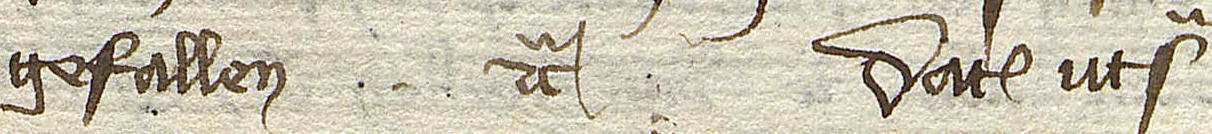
gefallen . ec* Dat* ut ſ*
